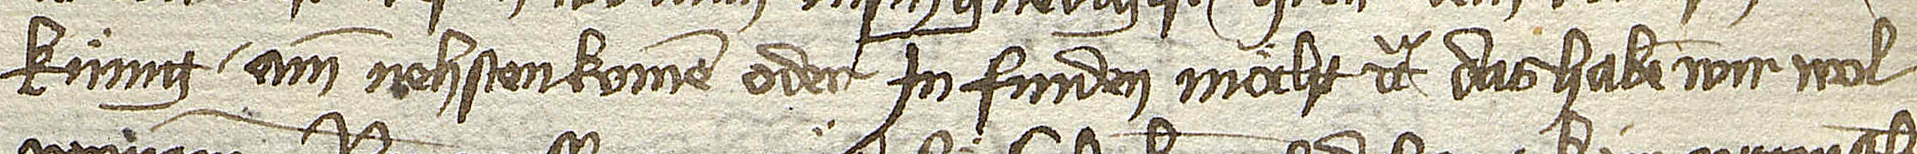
künig / am* nehſten kome* oder In finden möcht ec* das habe* wir wol
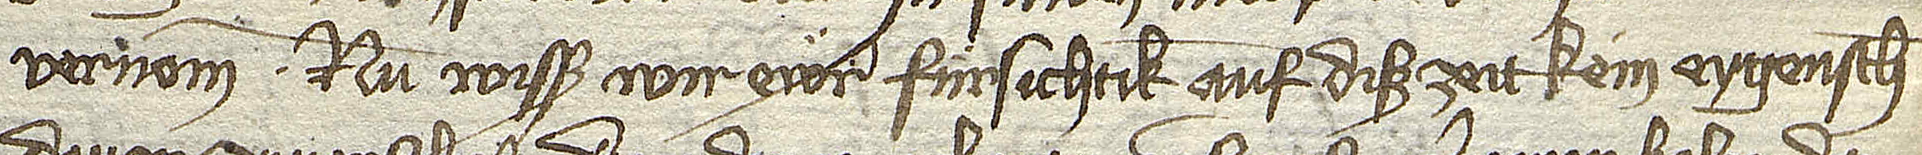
vernom* . Nu wiſſ* wir ew*r fürſichtik* auf diſʒ ʒeit kein eygenſch*
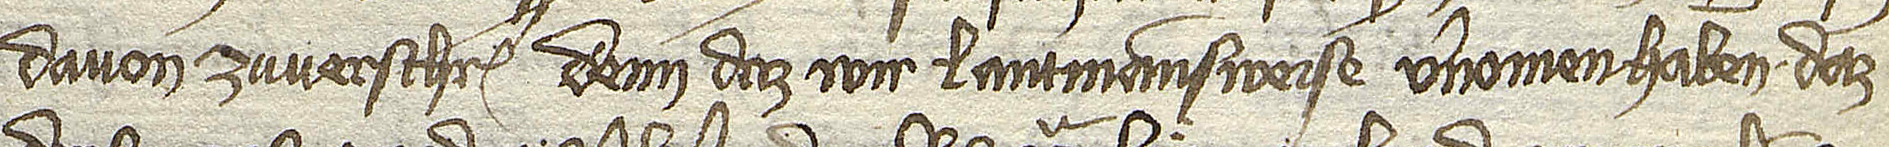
dauon ʒuuerſchr* denn daʒ wir lantmanſweiſe* v*nomen haben . daʒ
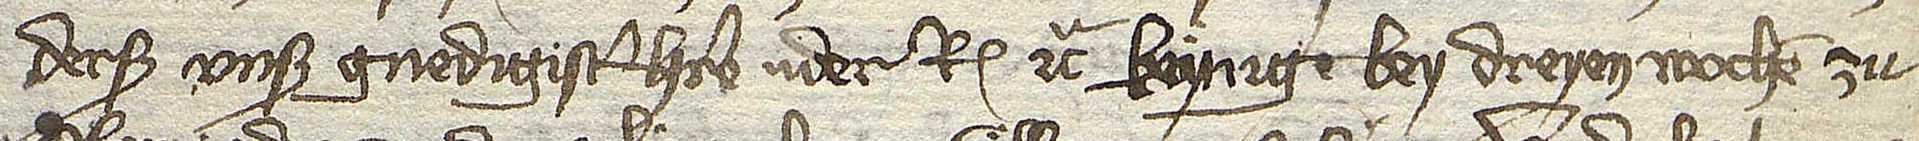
derſ* vnſ* gnedigiſt* hre* ~der R* ec* künig . bey dreyen woche* ʒu
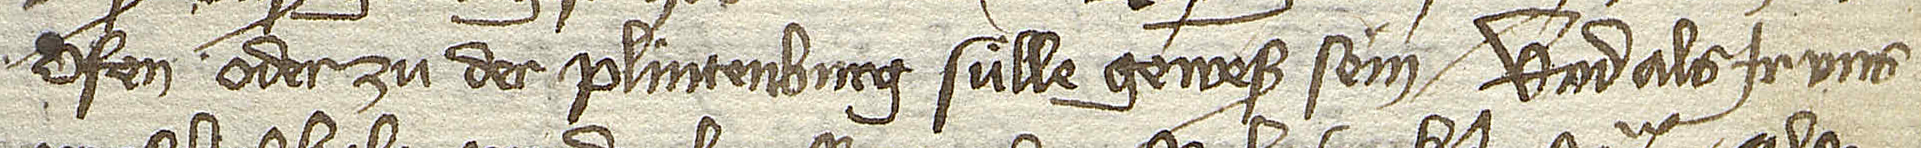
Ofen oder ʒu der plintenburg ſülle geweſ* ſein / Vnd als Ir vns
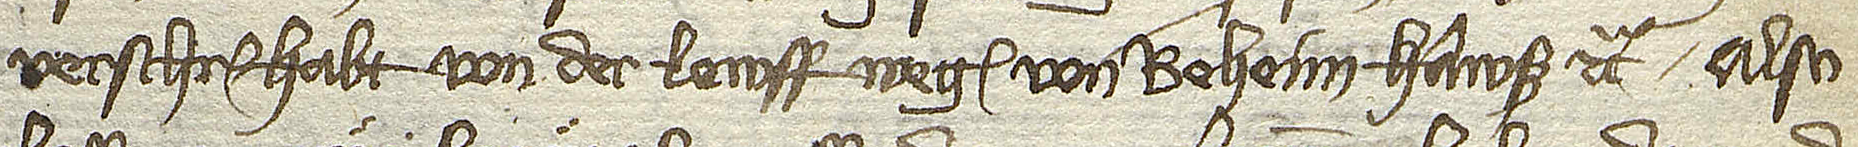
verſchr* habt von der lewff weg* von Beheim h*awſʒ ec* / Alſo
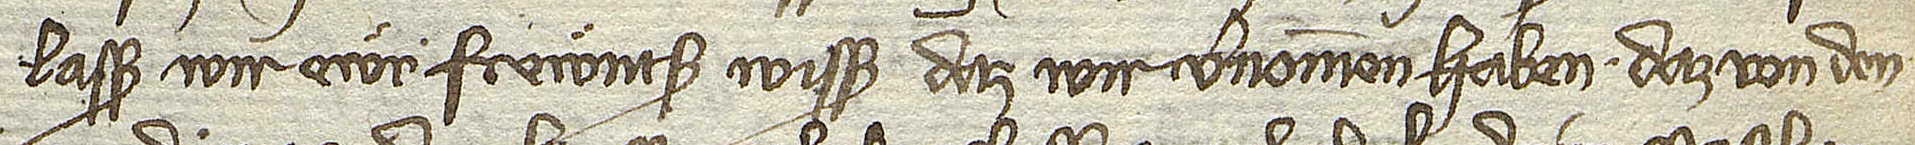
laſſ* wir ewr frewntſ* wiſſ* daʒ wir v*nomen* haben . daʒ von den
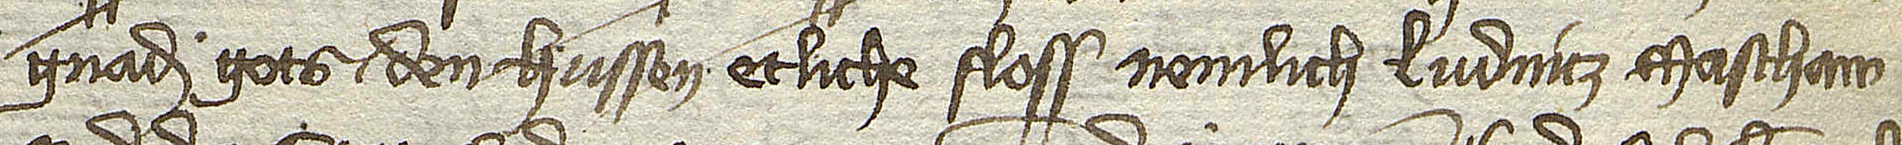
gnad* gots / den huſſen etliche ſloſſ nemlich ludnicʒ Maſchaw
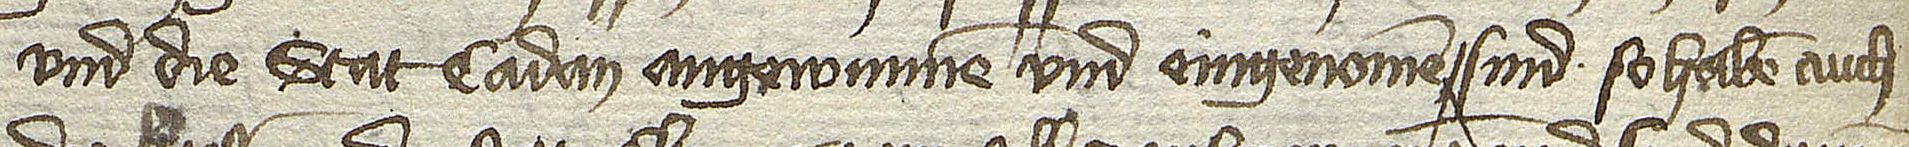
vnd die Stat Cadan angewunne* vnd eingenome* ſind . ſo habe* auch
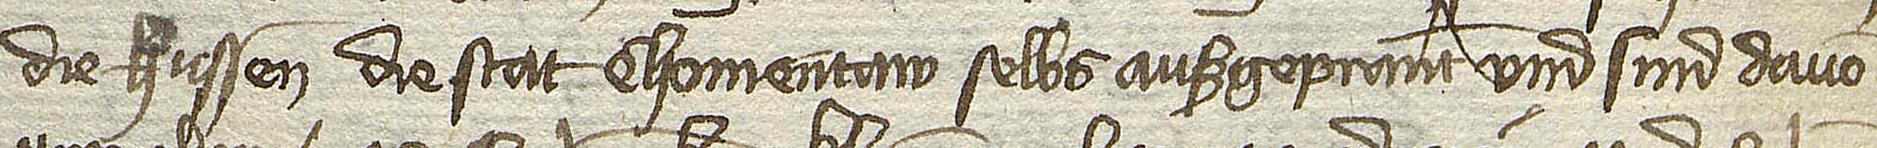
die huſſen die ſtat Chomentaw ſelbs auſʒgeprant* vnd ſind dauo*
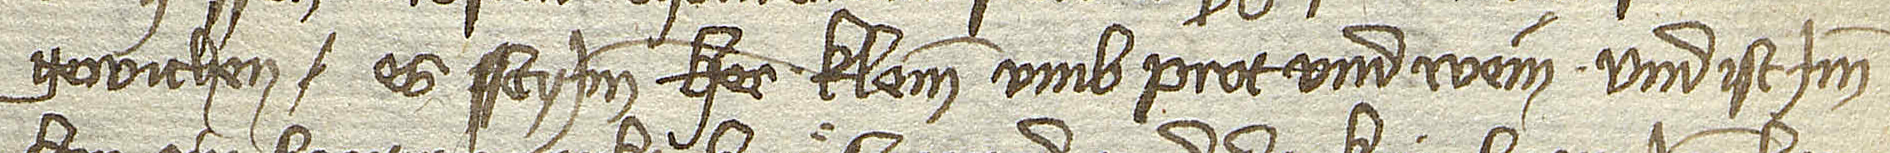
gewichen / es ſey Im* her . klein* vmb prot vnd wein . vnd iſt Im*
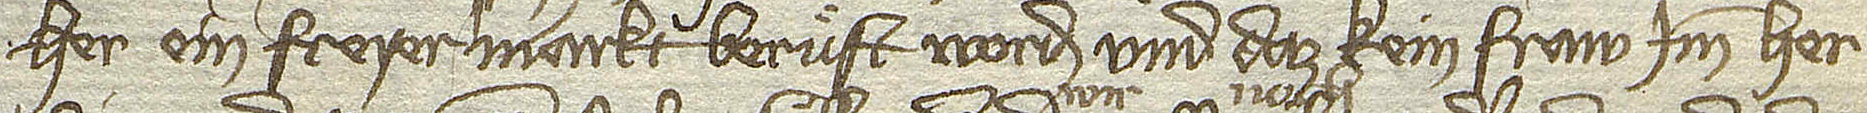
her ein freyer markt berüft word* vnd daʒ kein fraw Im* her
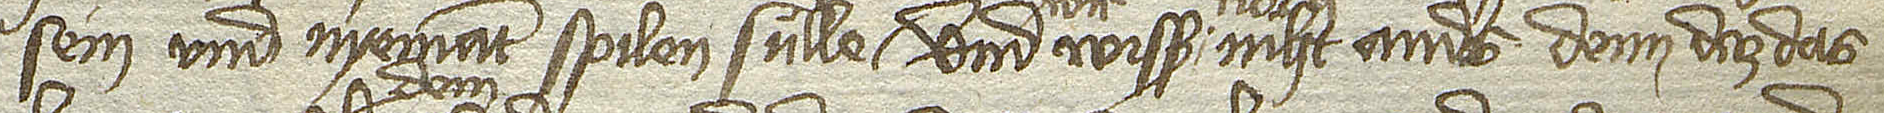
ſein vnd nyema*t ſpilen ſülle / Vnd wiſſ* niht and*s denn daʒ das
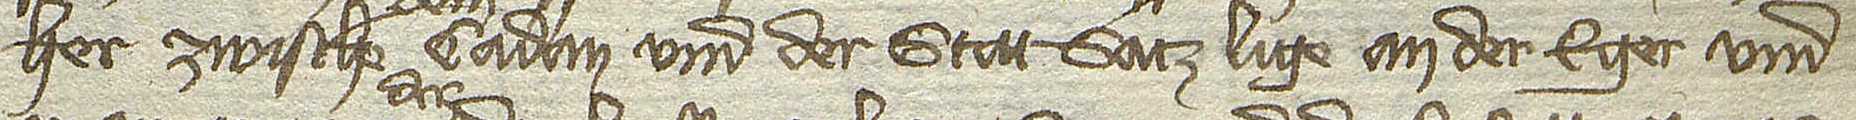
her ʒwiſche* Cadan vnd der Stat Sacʒ lige an der Eger vnd
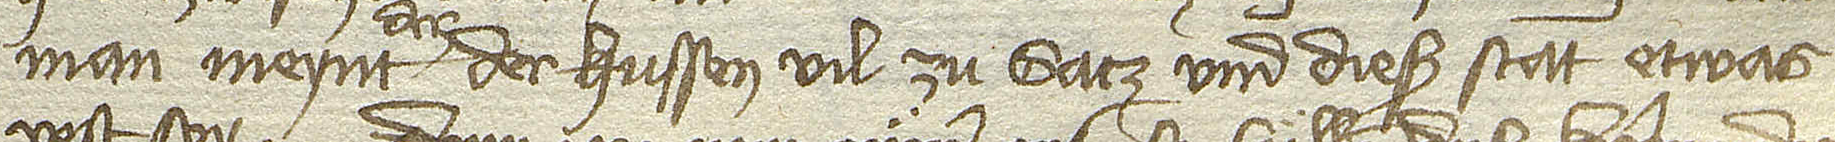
man meynt der huſſen vil ʒu Sacʒ vnd dieſ* ſtat etwas
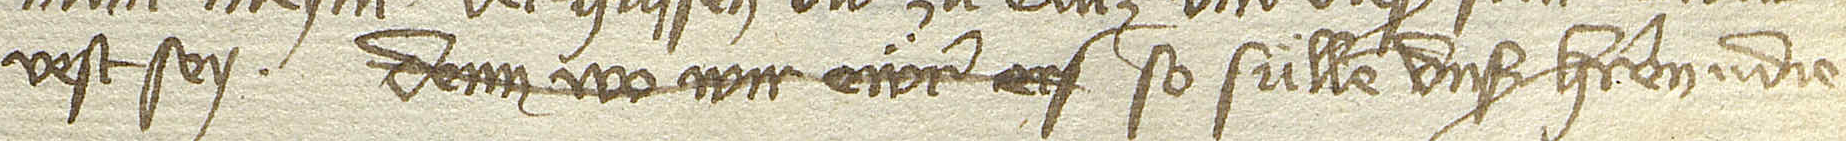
veſt ſey . Denn wo wir ewr* erſ ſo ſülle vnſ* hren* ~ die
